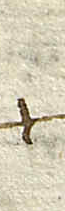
+
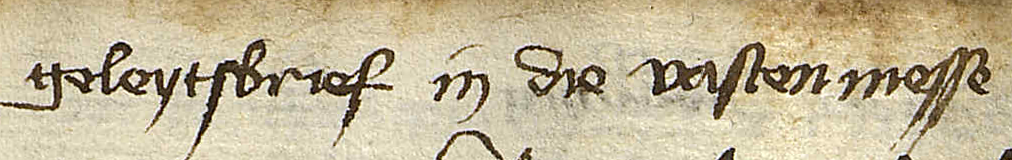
geleytbrief in die vaſten meſſe
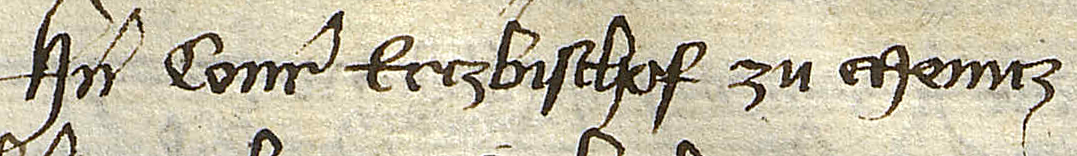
H*n Conr* Ercʒbiſchof ʒu Meincʒ
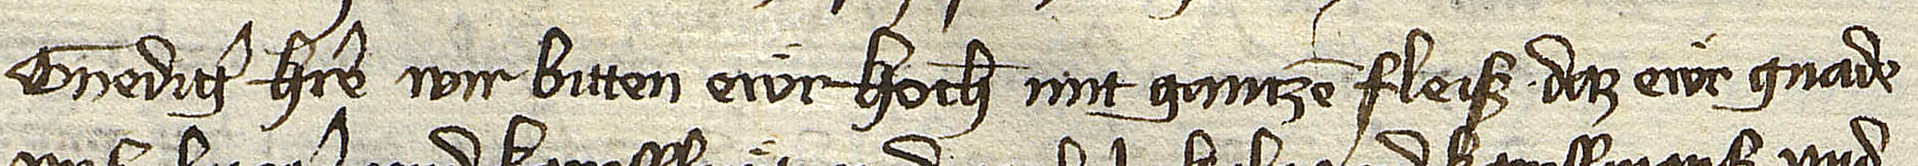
Gnedig* h*re wir bitten ewr hoch* mit gancʒe* fleiſʒ . daʒ ewr gnade
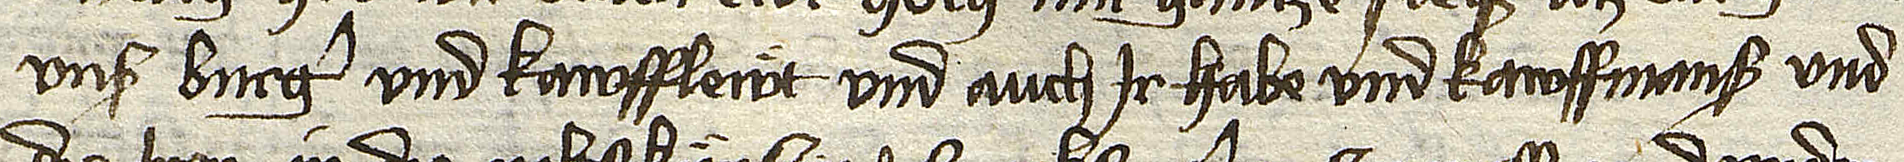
vnſ* burg* vnd kawfflewt vnd auch Ir habe vnd kawffmanſ* vnd
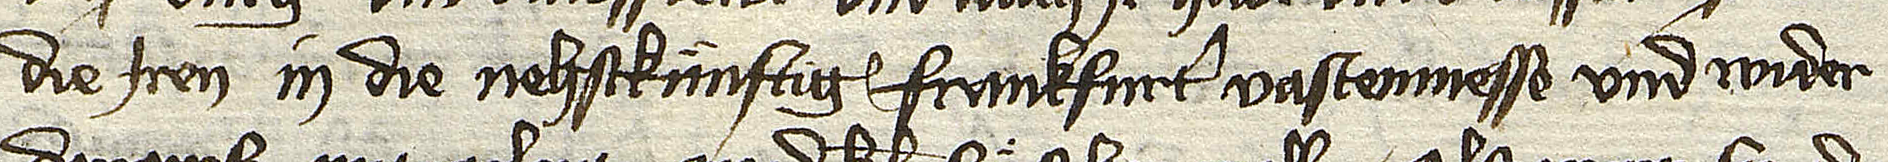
die Iren in die nehſtkünftig* frankfurt* vaſtenmeſſe vnd wider
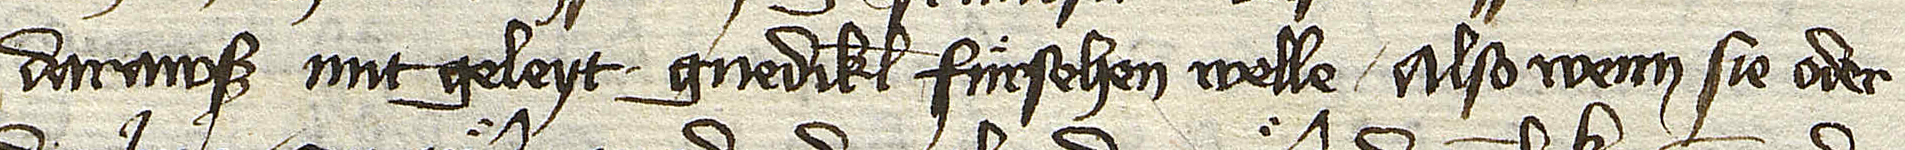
darawſʒ mit geleyt . gnedikl* fürſehen welle / Alſo wenn ſie oder
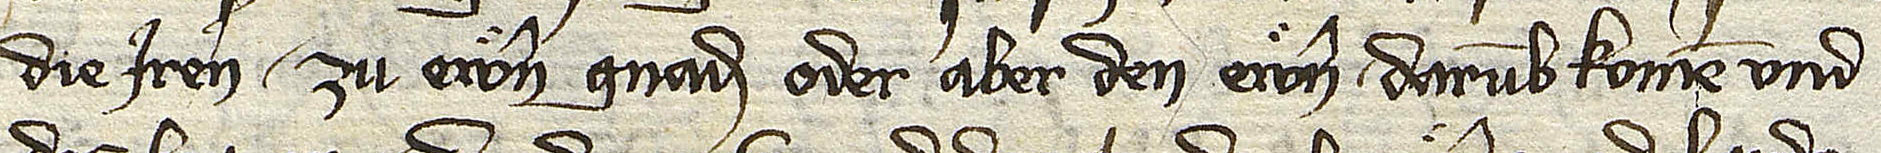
die Iren / ʒu ew*n gnad* oder aber den ew*n / daru*b kome* vnd
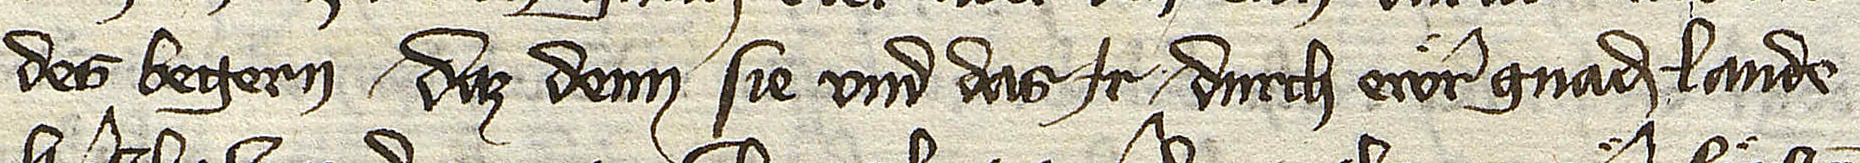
des begern / daʒ denn ſie vnd das Ir / durch ew*r gnad* lande
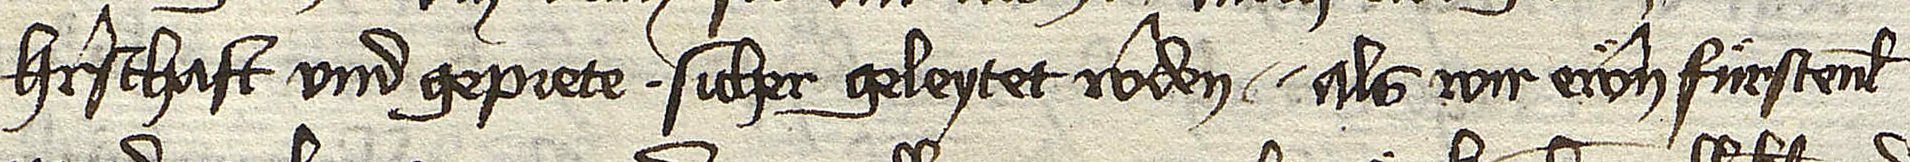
h*rſchaft vnd gepiete . ſicher geleytet w*den // als wir ew*n fürſtenl*
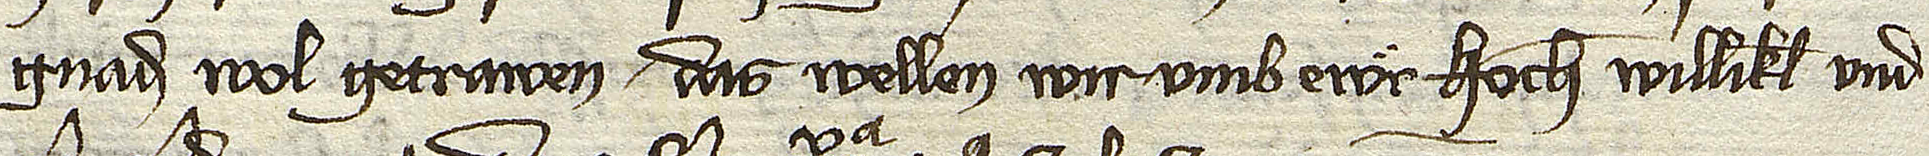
gnad* wol getrawen / das wellen wir vmb ewr hoch* willikl* vnd
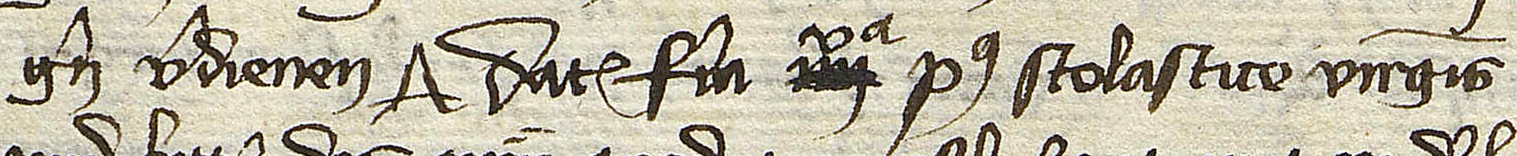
g*n v*dienen Dat* fia* iiii p* ſtolaſtice virg*is
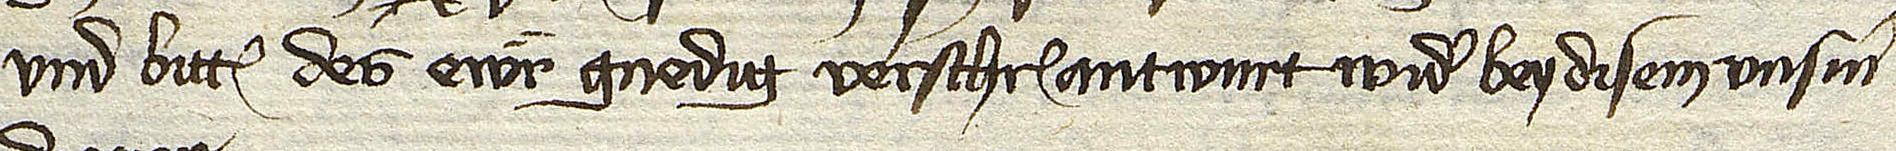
vnd bitt* des ewr gnedig verſchr* antwurt wid* bey diſem vnſ*m
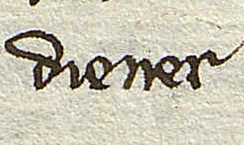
diener
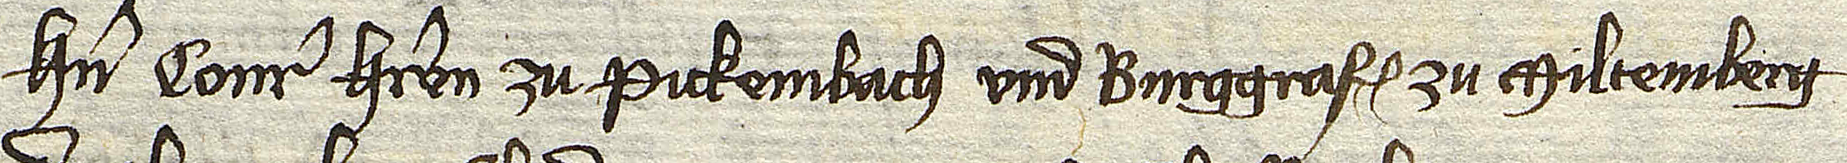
H*n Conr* h*ren ʒu Pikembach vnd Burggraf* ʒu Miltemberg
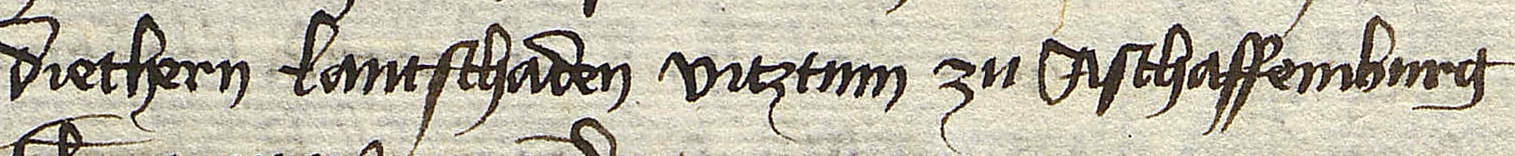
diethern lantſchaden vicʒtum ʒu Aſchaffemburg
